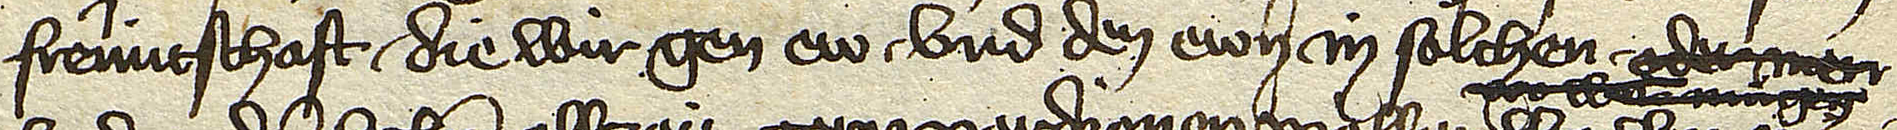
freuntſchaft / die wir gen ew / vnd den ewn* in ſölchen / oder merr
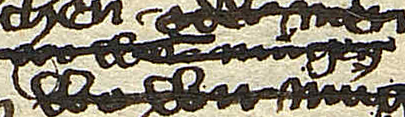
wo wir mügen
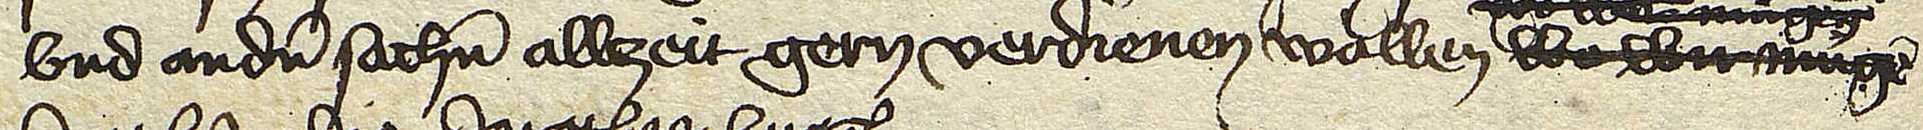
vnd andn* ſachn* allcʒeit gern verdienen wollen wo wir müge*
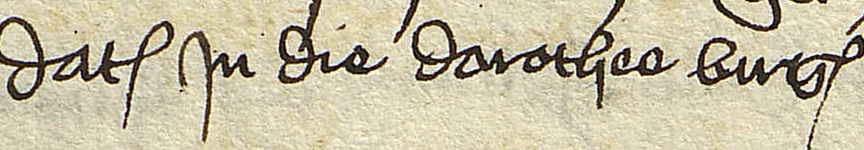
dat* In die dorothee virg*
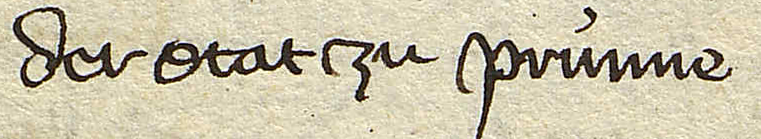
der Stat cʒu Prünne
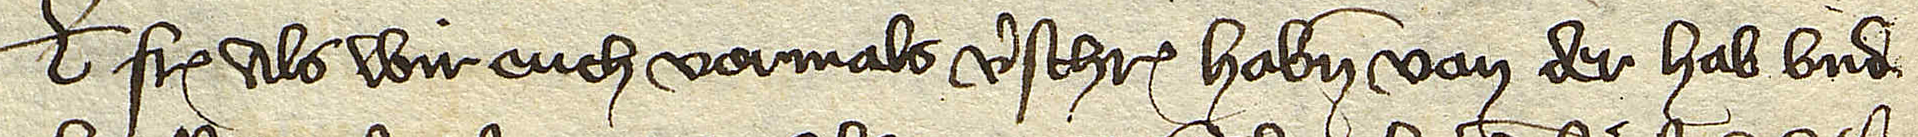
L* fr* Als wir euch vormals v*ſchr* habn* von der hab vnd
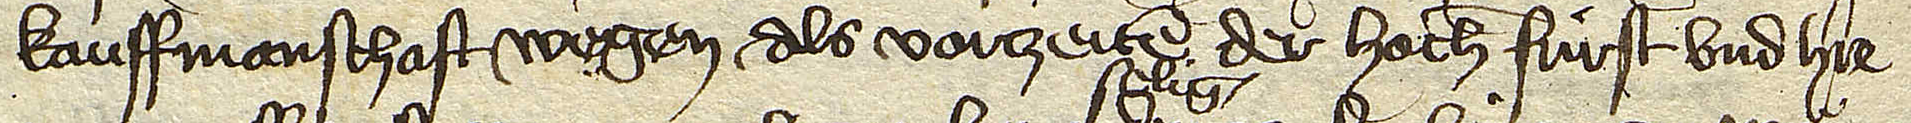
kauffmanſchaft wegen / als vorcʒeite* der hoch* fürſt vnd h*re
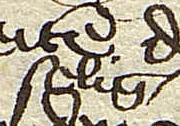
ſelig*
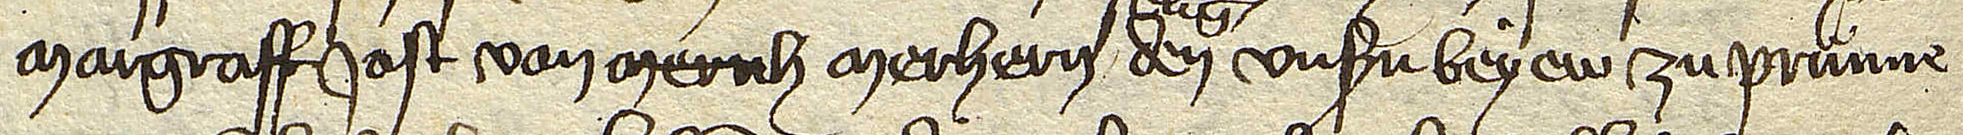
Margraff Ioſt von Mernh Merhern den vnſ*n bey ew cʒu Prünne
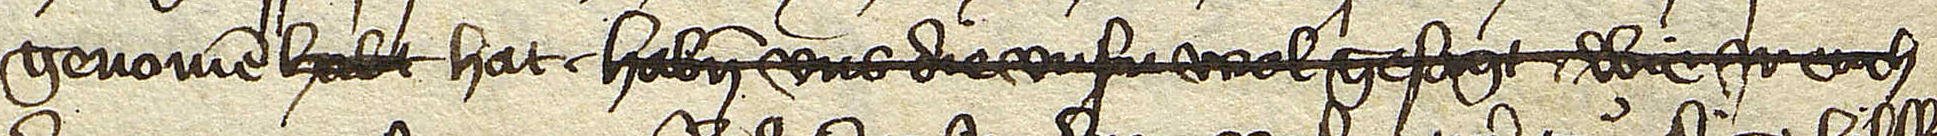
genome* habt hat / habn* vns die vnſ*n wol geſagt / wie Ir euch
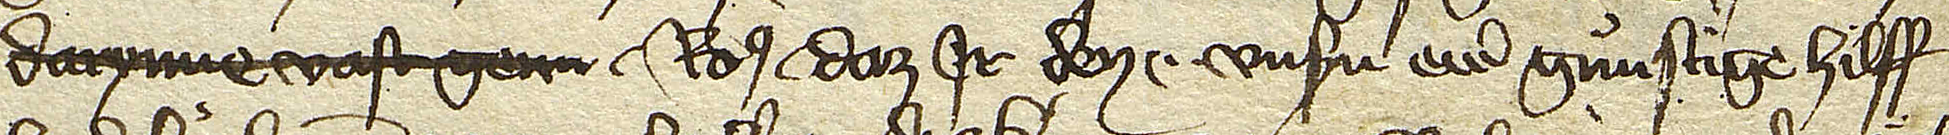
darynne vaſt gen / Ro* / daʒ Ir den / ~ vnſ*n ew* günſtige hilff
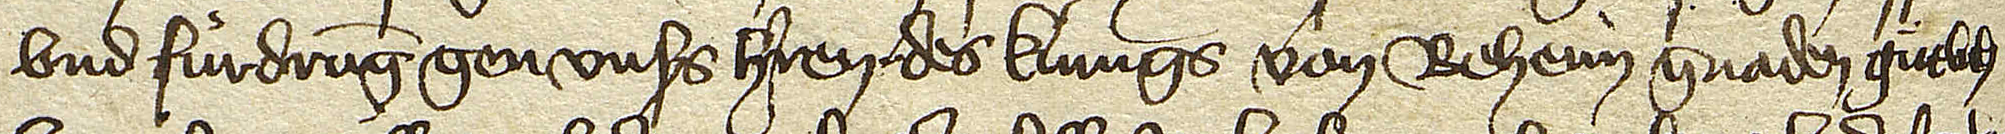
vnd fürdrug* gen vnſ*s h*ren ~ des künigs von Beheim gnaden gütlich
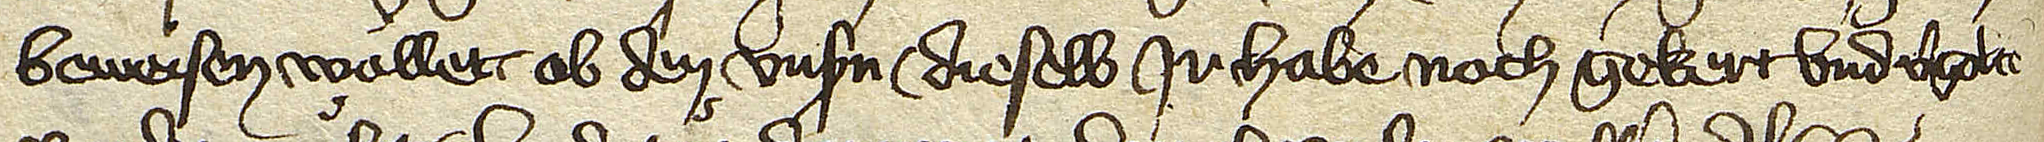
beweiſen wölet / ob den vnſ*n / dieſelb Ir habe noch gekert vnd v*golte*
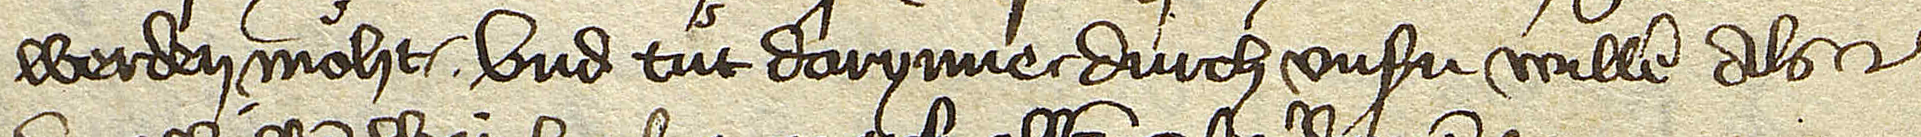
werden möht / vnd tüt darynne / durch vnſ*n wille* Als ec*
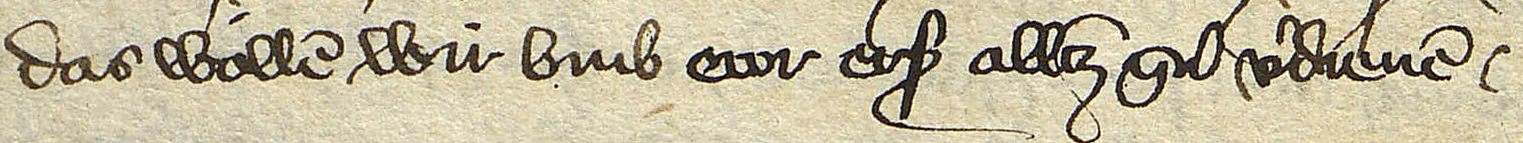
das wölle wir vmb ewr erſ* allcʒ* gn* v*diene* /
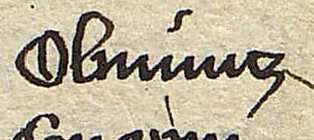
Olmüncʒ
